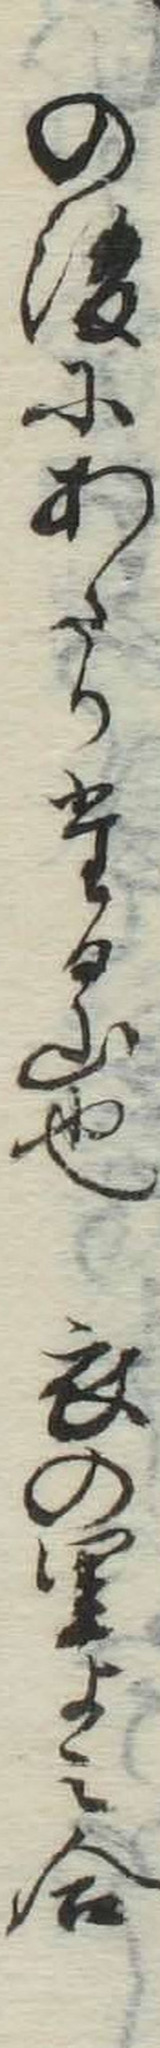の後にあたりたる山也衣の里よみ合
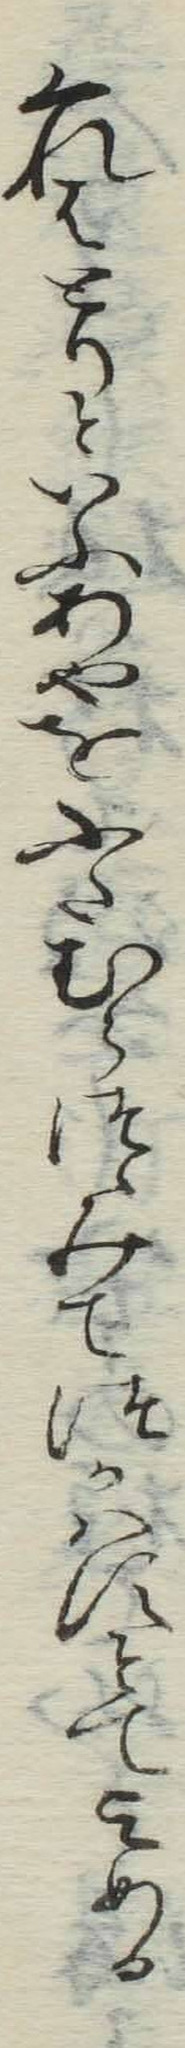くれはとりといふあやをふたむらつゝみてつかはすとてよめる
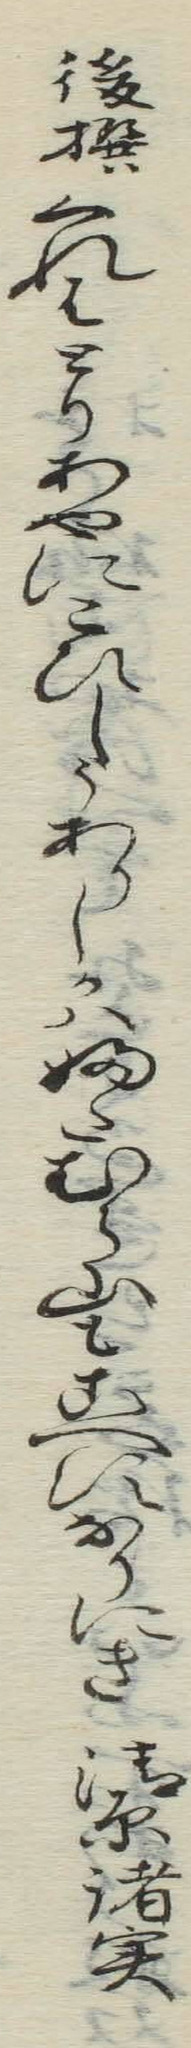後撰くれはとりあやにこひしうありしかはふたむら山もこへすなりにき清原諸実
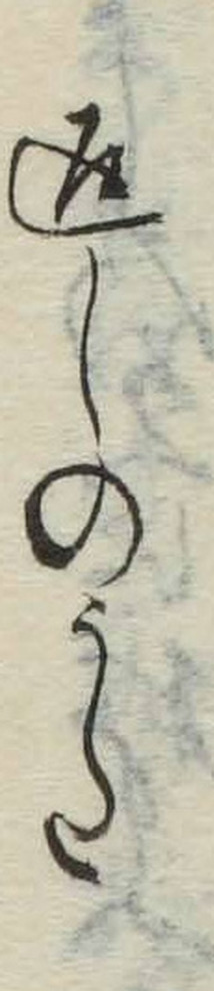返しのうた
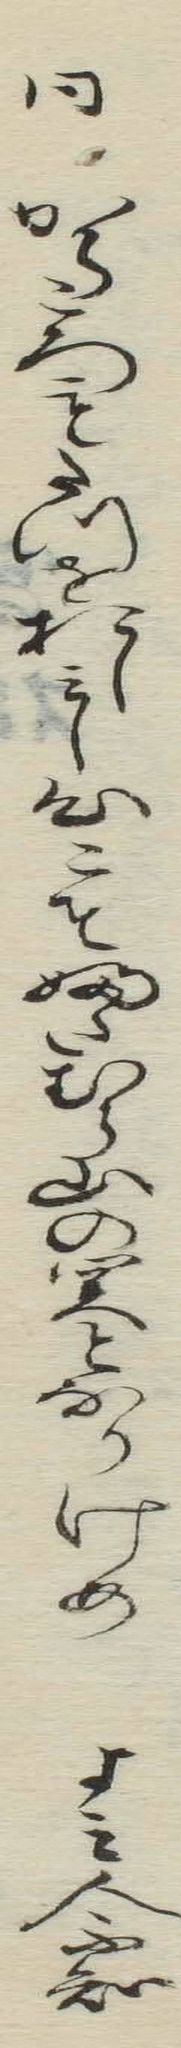同からころもたつをおしみし心こそふたむら山の関となりけめよみ人不知
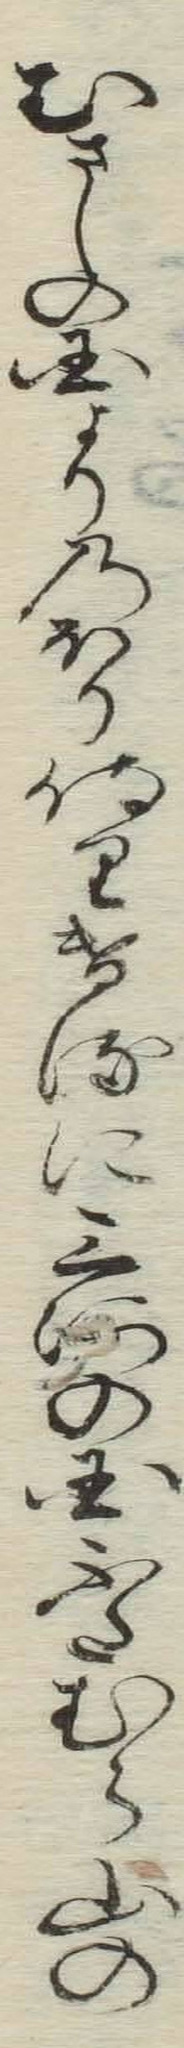むさしの国よりのほり侍りけるに三河の国ふたむら山の
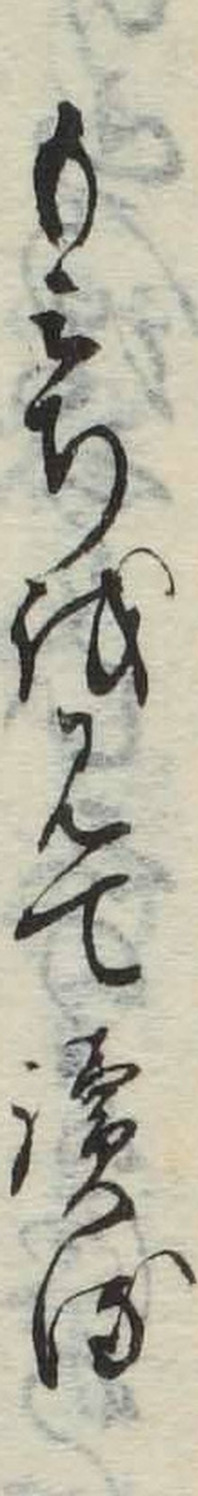もみちを見て読る
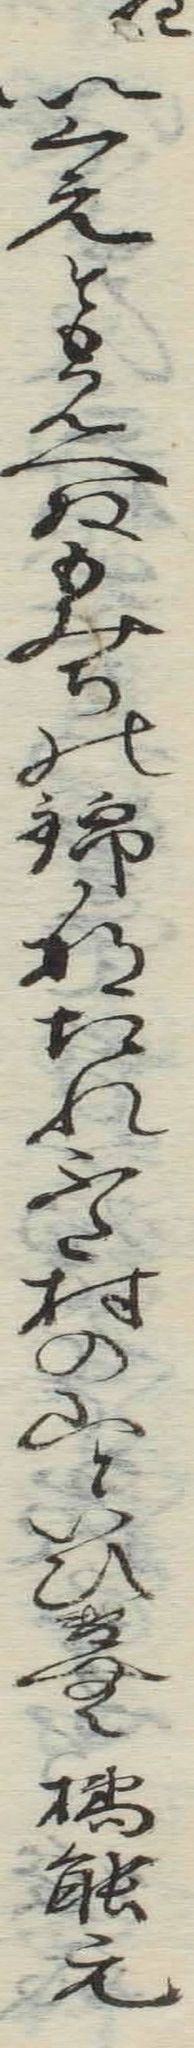詞花いくえとも見へぬもみちの錦かなたれふた村の山といひけむ橘能元
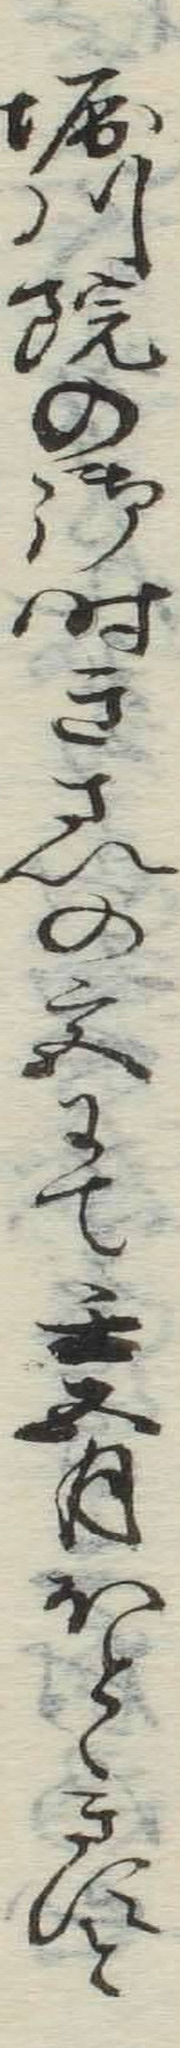堀川院の御時きさいの宮にて壬五月ほとゝきすと
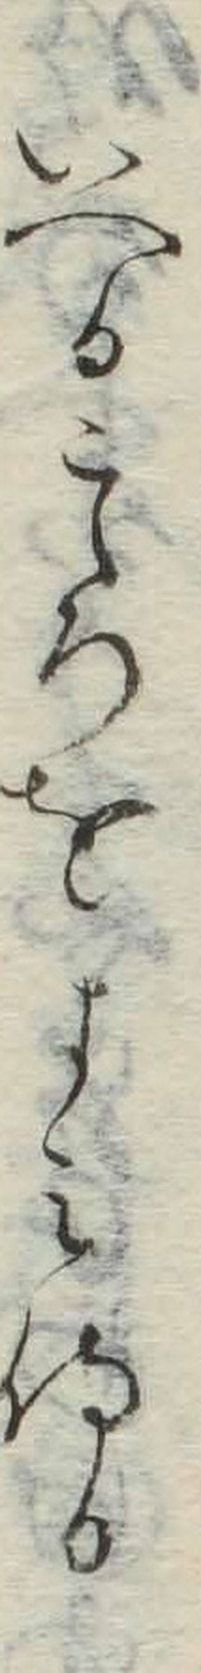いへるこゝろをよみ侍る
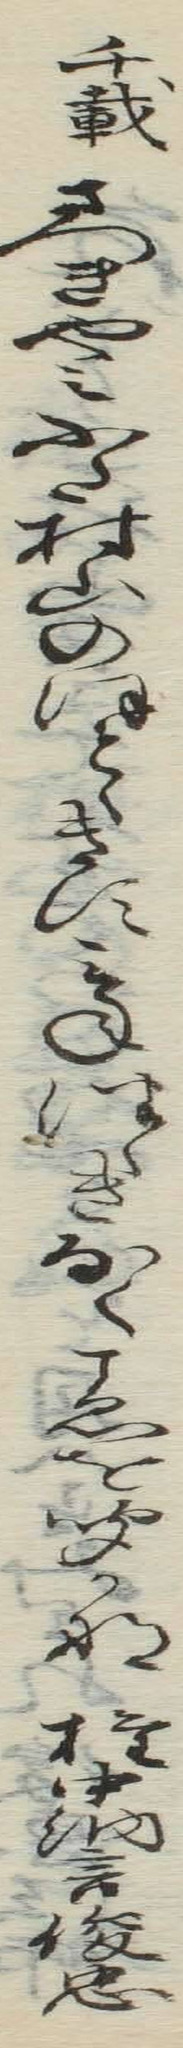千載さつきやみふた村山のほとゝきすみねつゝきなくこゑを聞かな權中納言俊忠
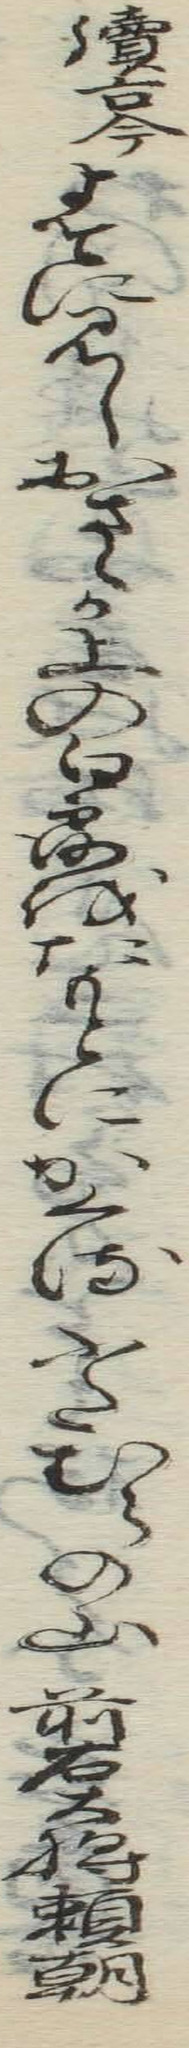続古今よそに見しおさゝか上の白露をたもとにかくるふたむらの山前右大將頼朝
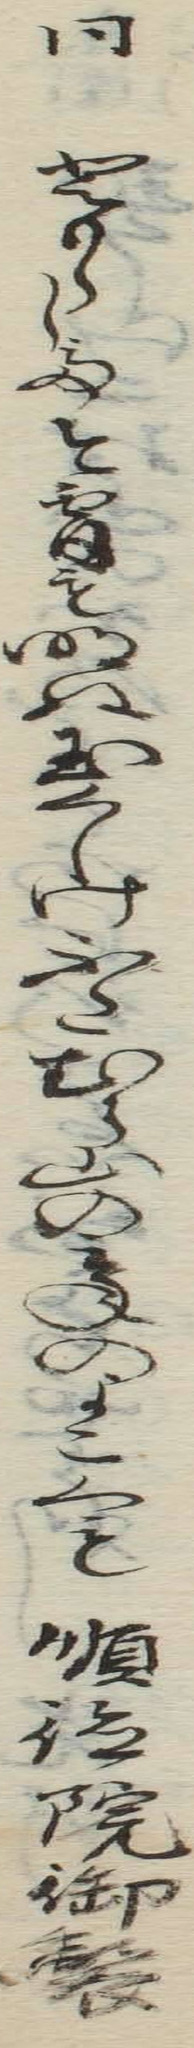同ともしして今宵も明ぬ玉くしけふたむら山のみねのよこくも順徳院御製
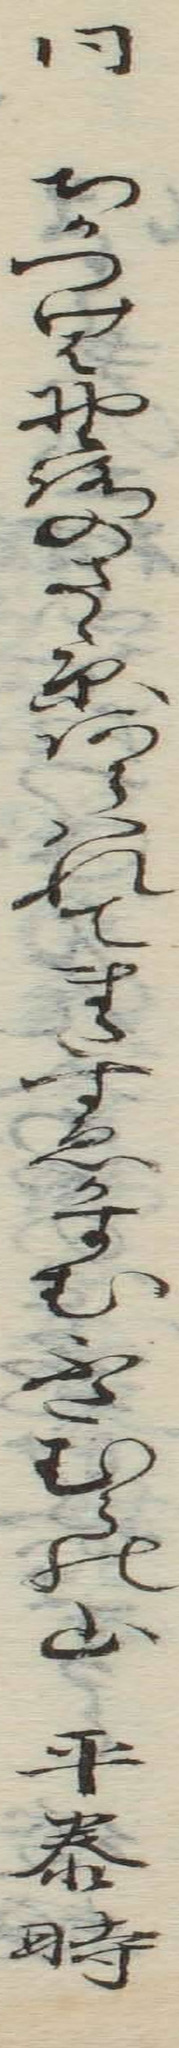同ちかつけは野路のさゝ原あらはれてまたすゑかすむふたむらの山平泰時
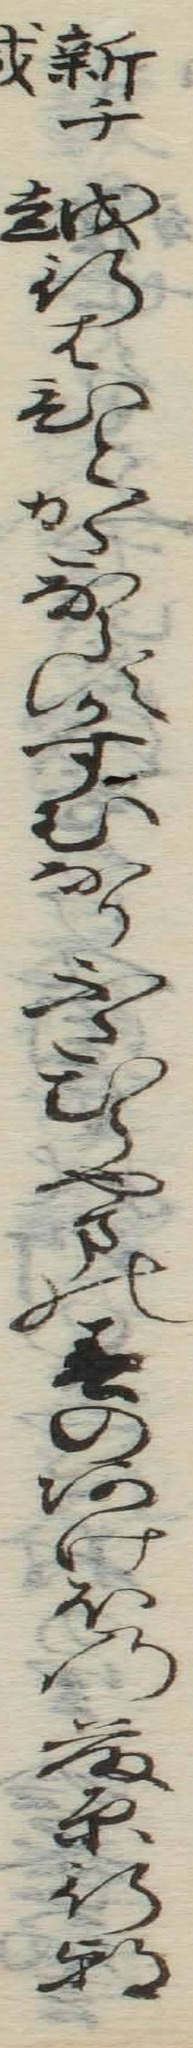新千載越行はひとかたならすかすむなりふたむらやまの春のあけほの藤原行朝
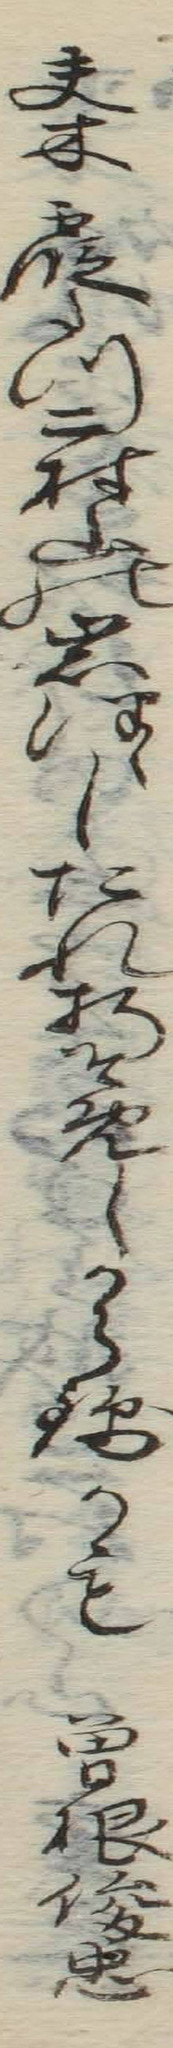夫木霞たつ二村山の岩つゝしたれ折そめしから錦かも曽根俊忠
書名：三河国二葉松
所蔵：国文学研究資料館
